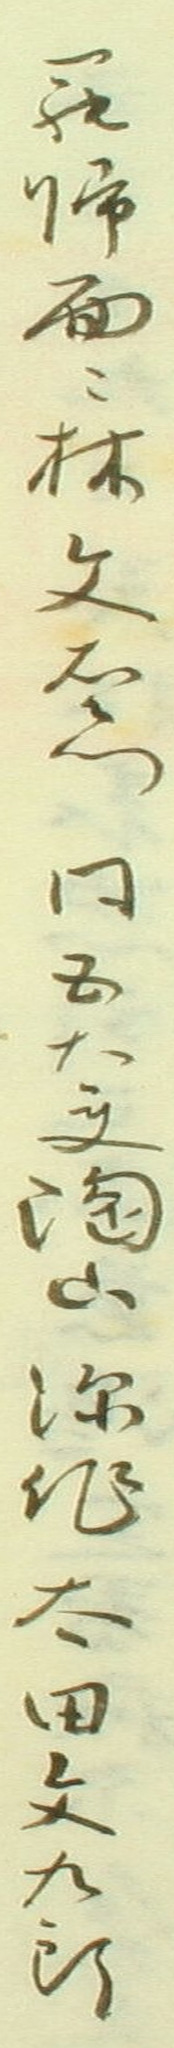罷帰面に林文右衛門同五太夫陶山源作太田文九郎
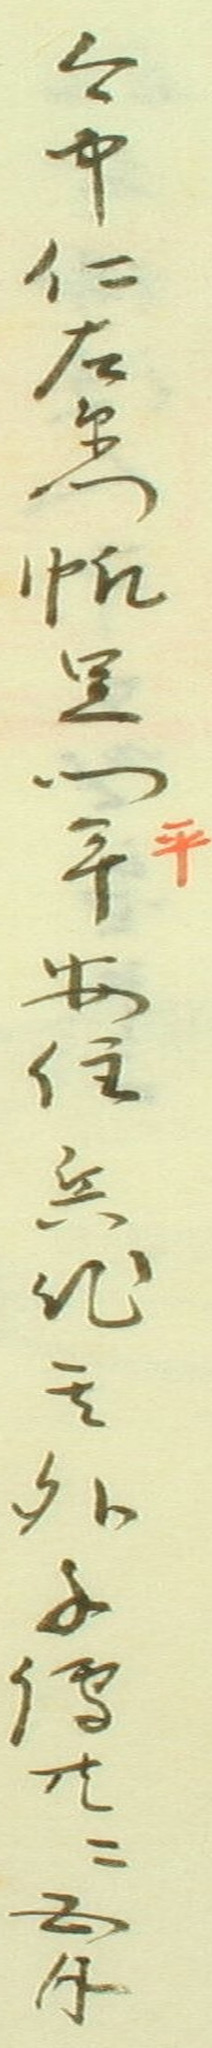今中仁左衛門帆足門平安住兵作其外手伝共に五月
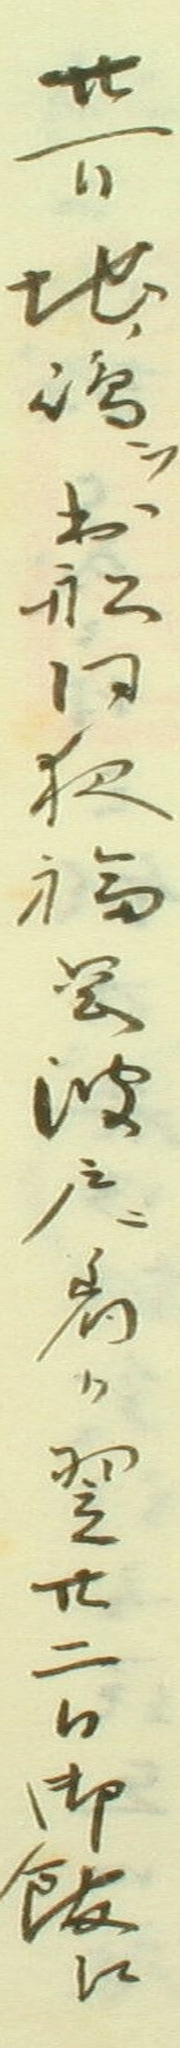廿一日地の嶋ら出船同夜福岡波戸に着り翌廿二日御飯江
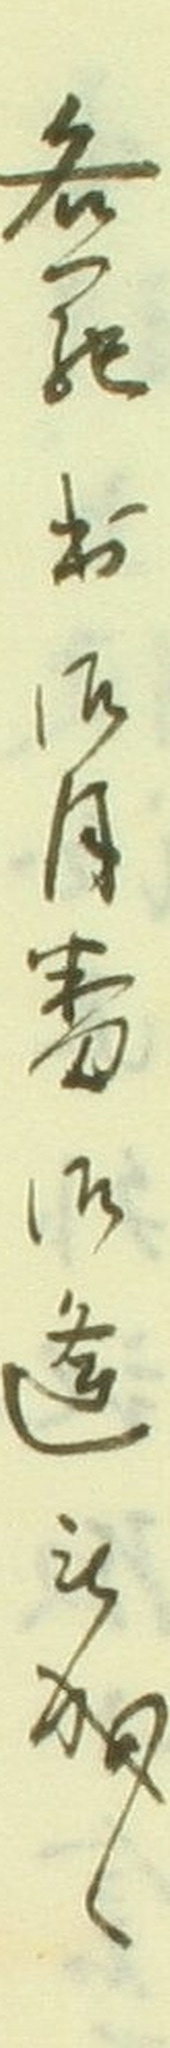各罷出御月番御逢被成候
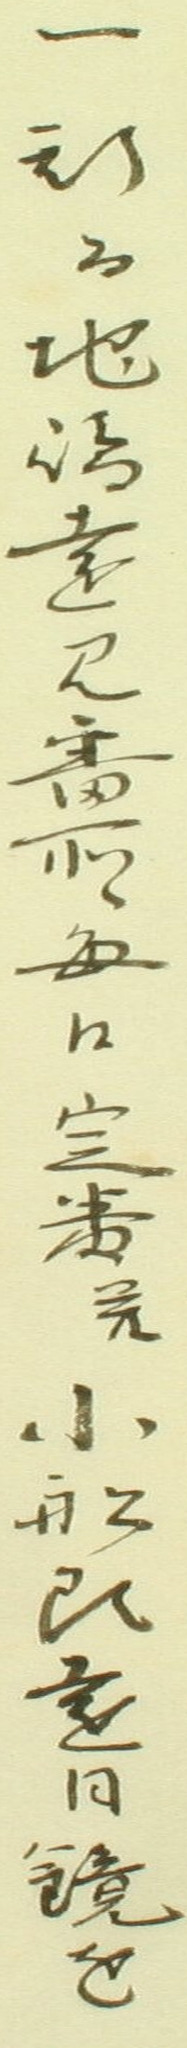一斯而地嶋遠見番所へ毎日定番並び小船頭遠目鏡を
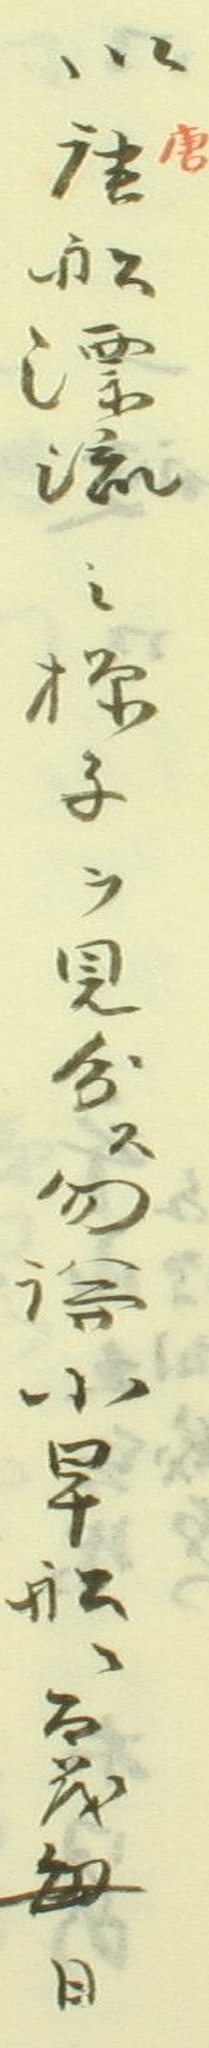以唐船漂流の様子を見分す勿論小早船へ而も毎日
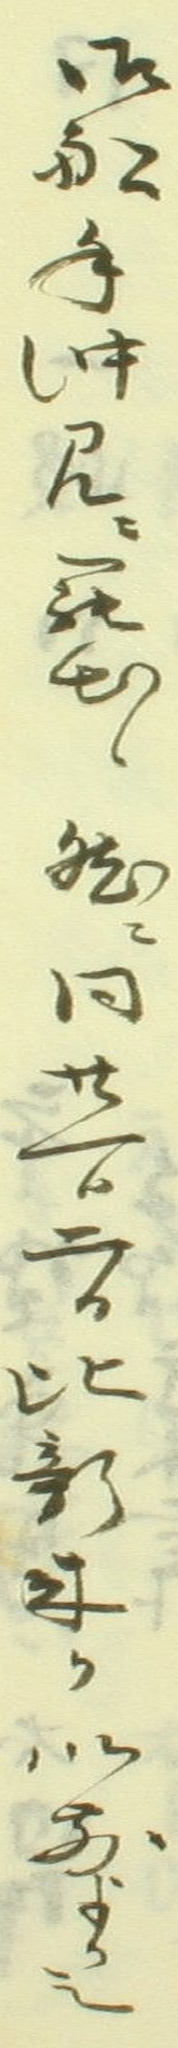御船手沖見に罷出候然に同廿一日二日比新来り以前より之
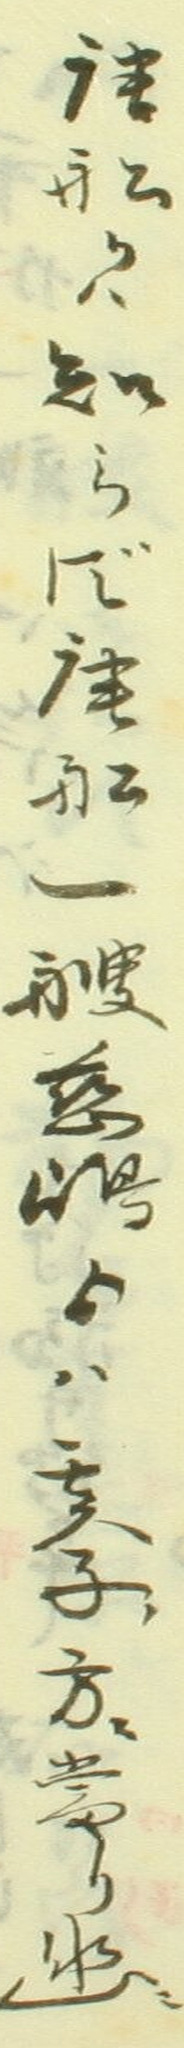唐船かは知らず唐船一艘慈嶋ゟは亥子の方に当り遂に
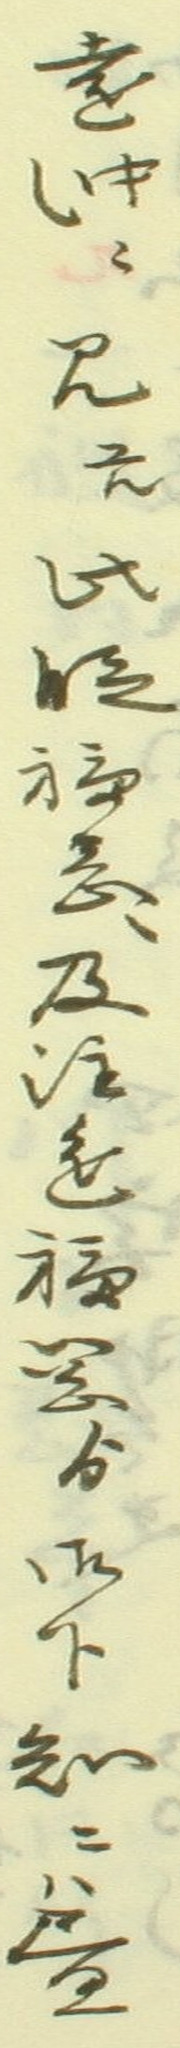遠沖に見えん此段福岡へ及注進福岡ゟ御下知には昼
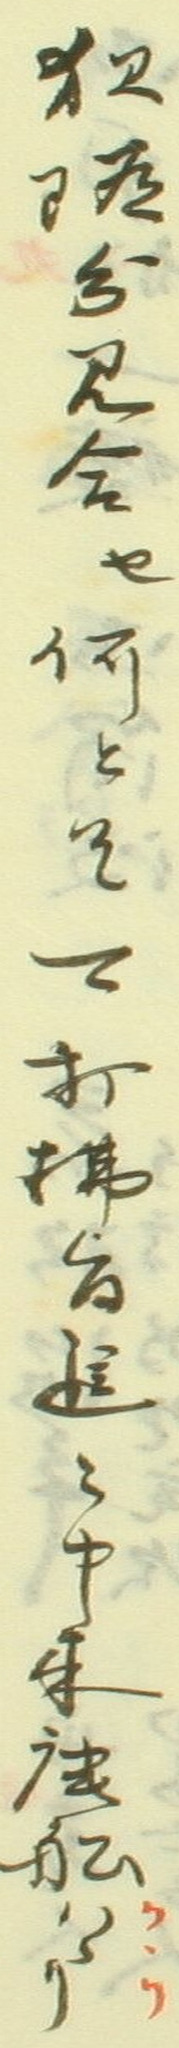夜随分見合せ何とそ可打払旨追々申来唐船ははり
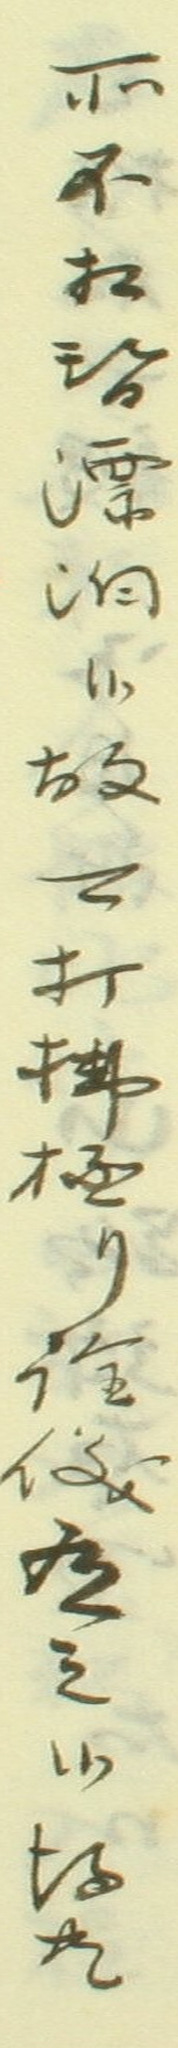所不相替漂泊候故可打払極り詮儀有之候得共
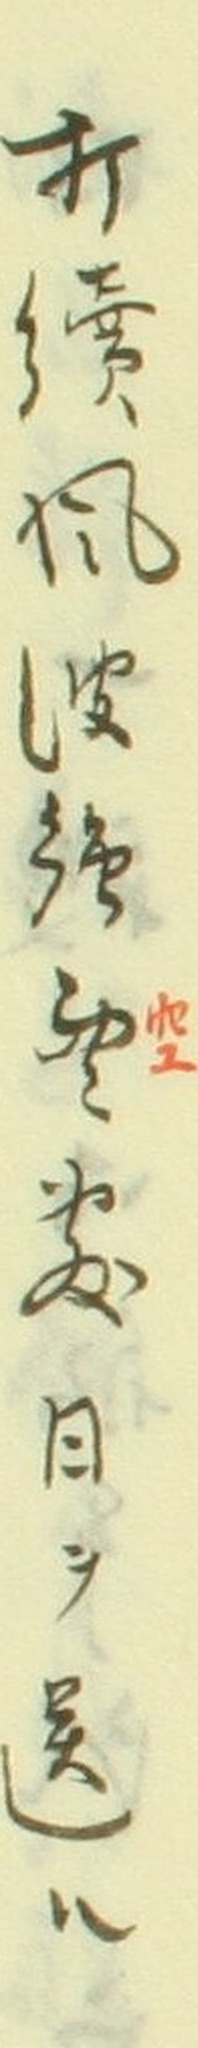打続風波強空敷日を送る
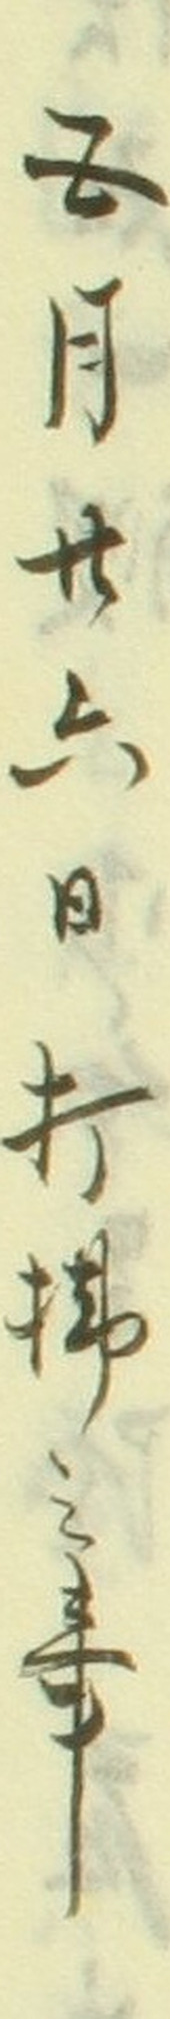五月廿六日打払之事
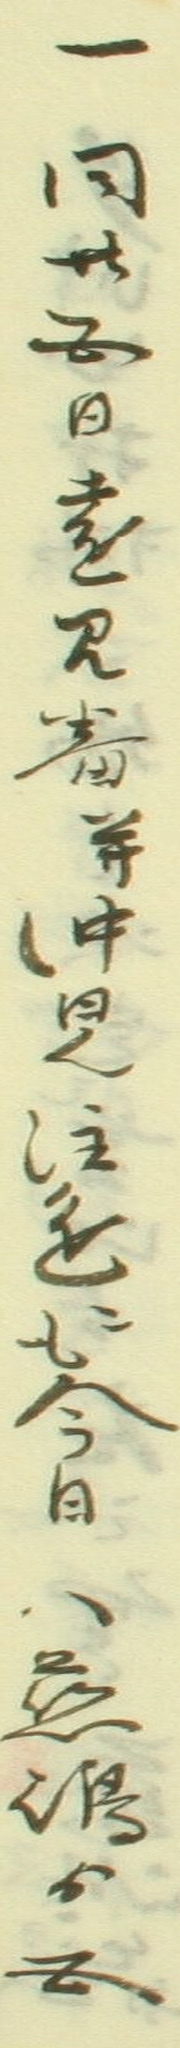同廿五日遠見番並沖見注進にも今日へ慈嶋ゟ五
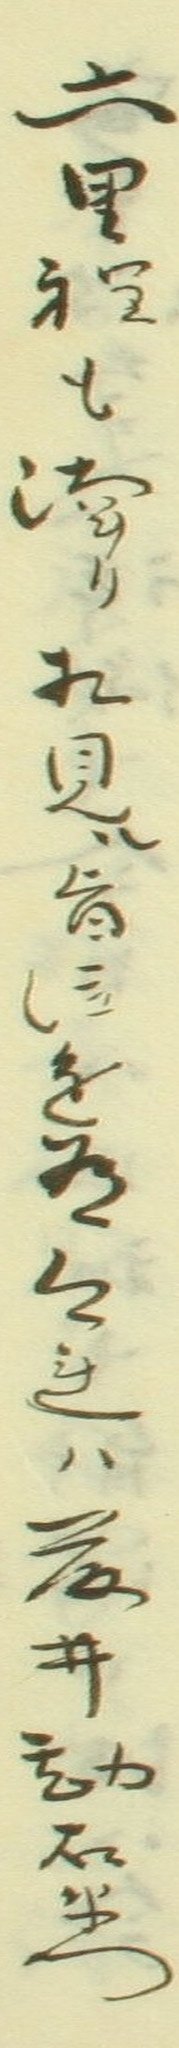六里程も？り相見る旨注進有今迄は藤井勘右衛門

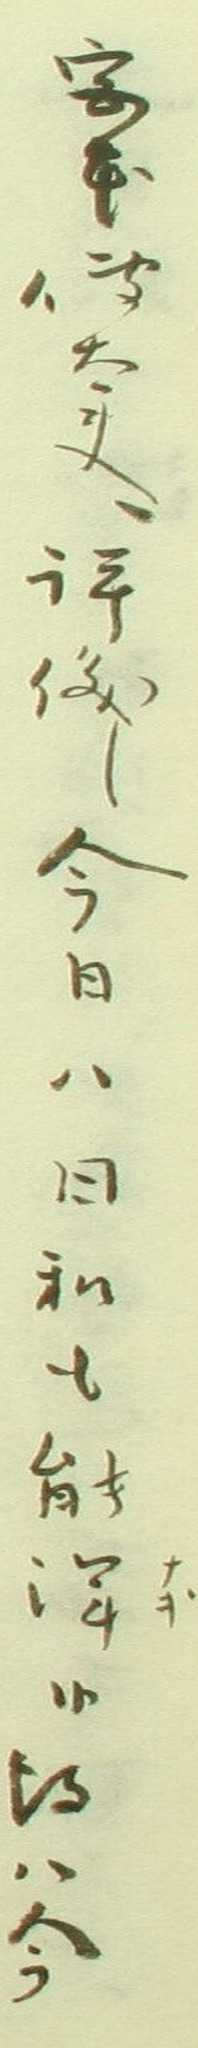宮本伝太夫へ評儀し今日は日和も能洋候得は今
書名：唐船漂流記 三
